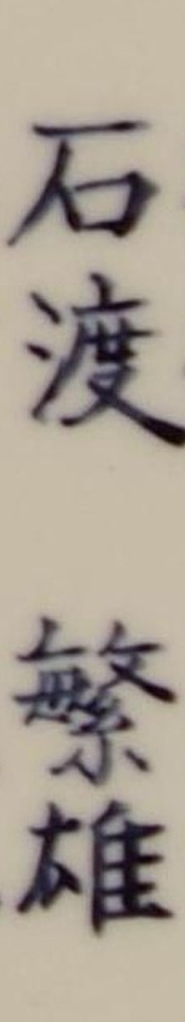石渡繁雄
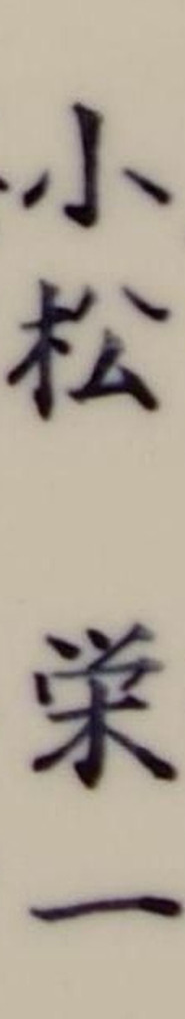小松栄一
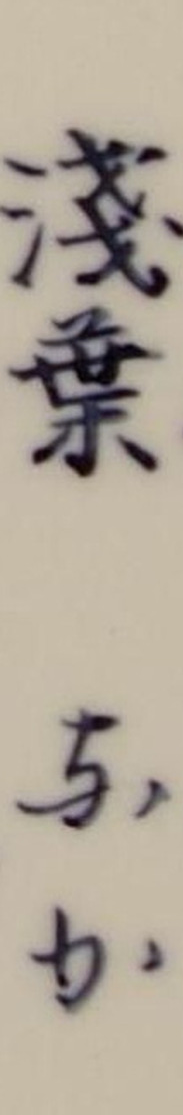浅葉なか
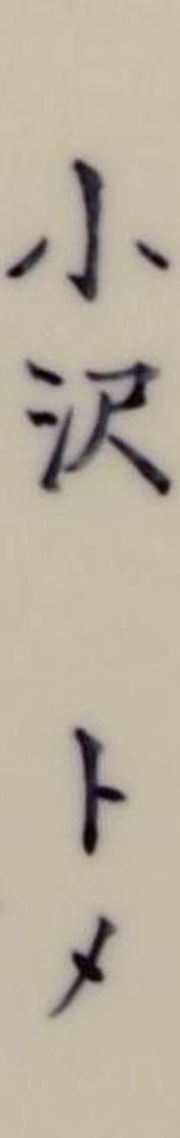小沢トメ
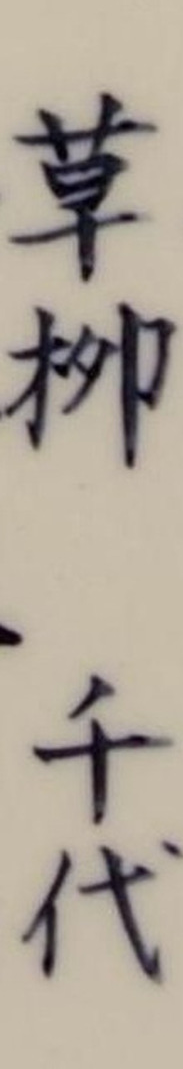草柳千代
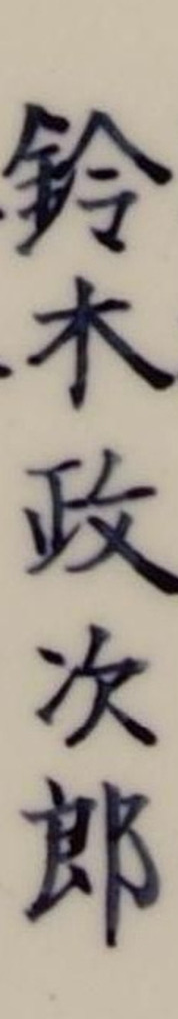鈴木政次郎
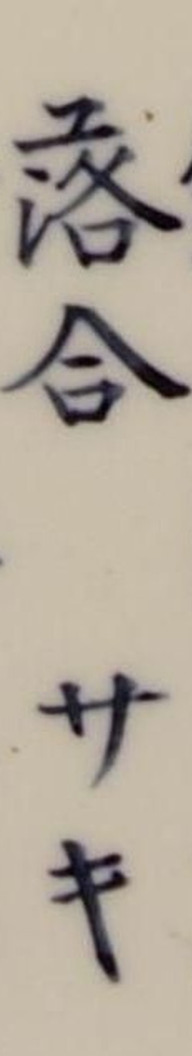落合サキ
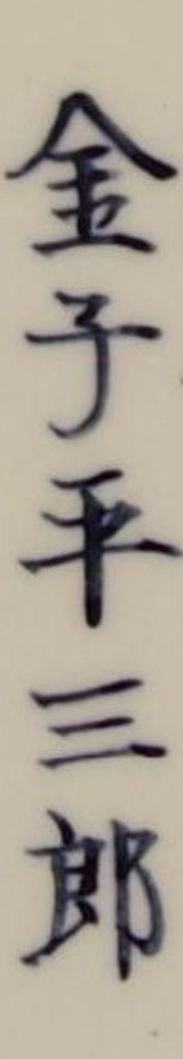金子平三郎
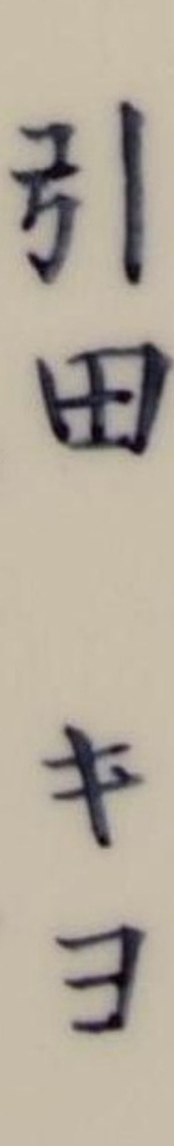引田キヨ
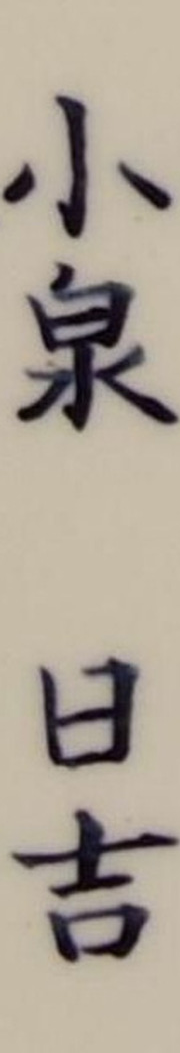小泉日吉
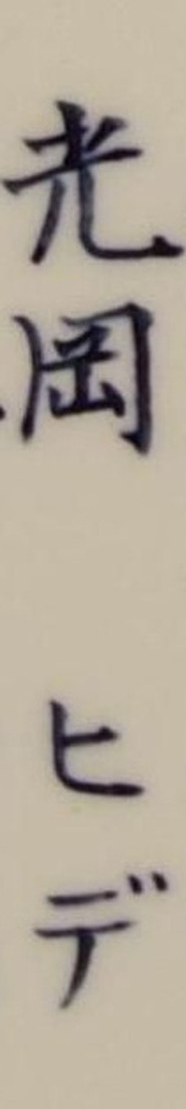光岡ヒデ
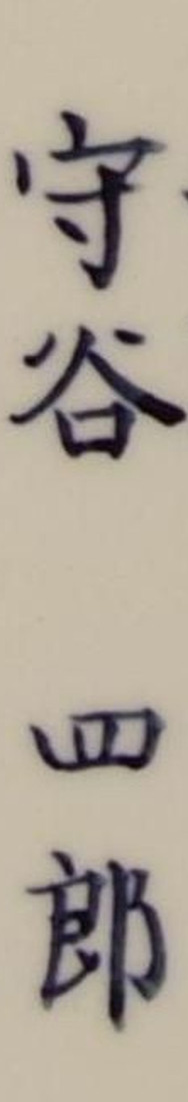守谷四郎
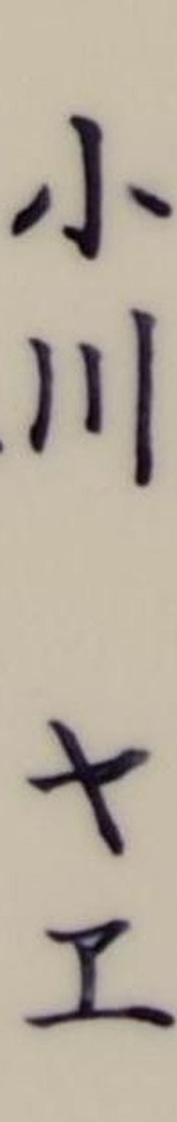小川ヤヱ
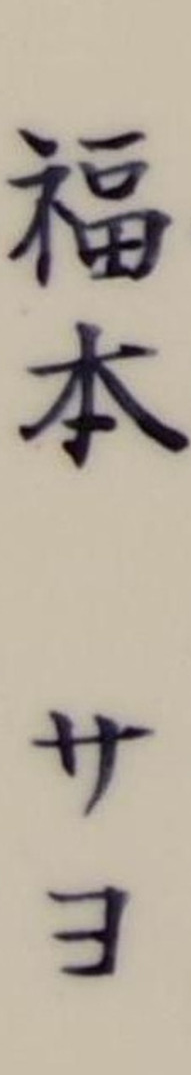福本サヨ
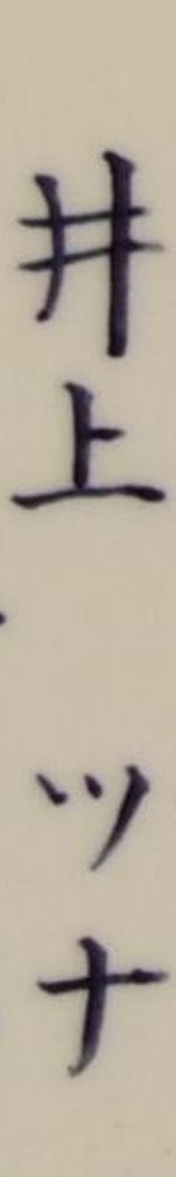井上ツナ
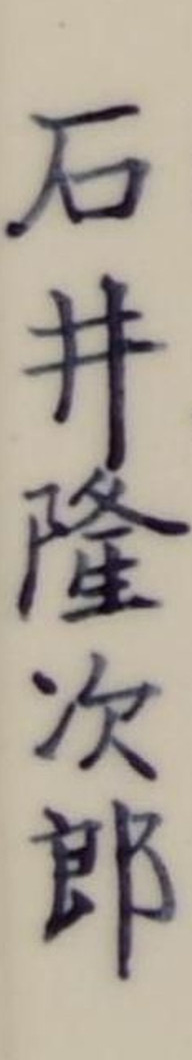石井隆次郎
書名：M~S
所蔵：高野山金剛峯寺
